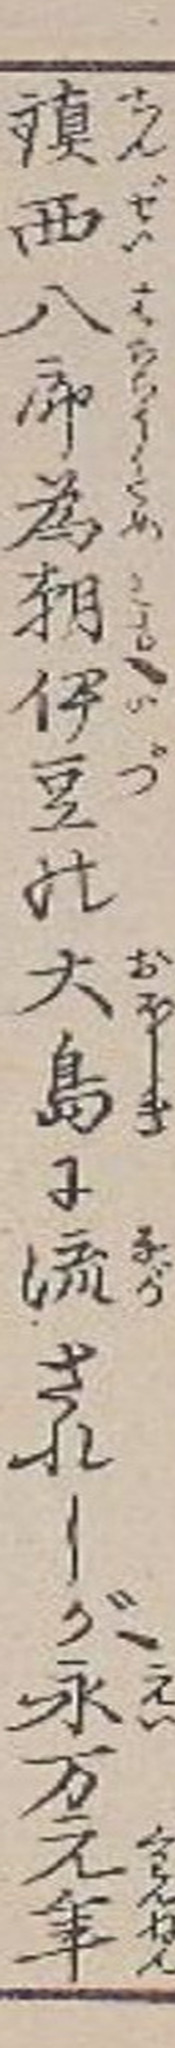鎮西八郎為朝、伊豆の大島に流されしが、永万元年
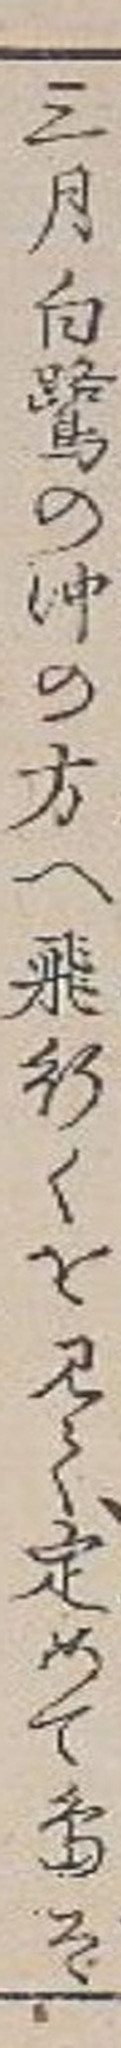三月、白鷺の沖の方へ飛行くを見て、定めて島ぞ
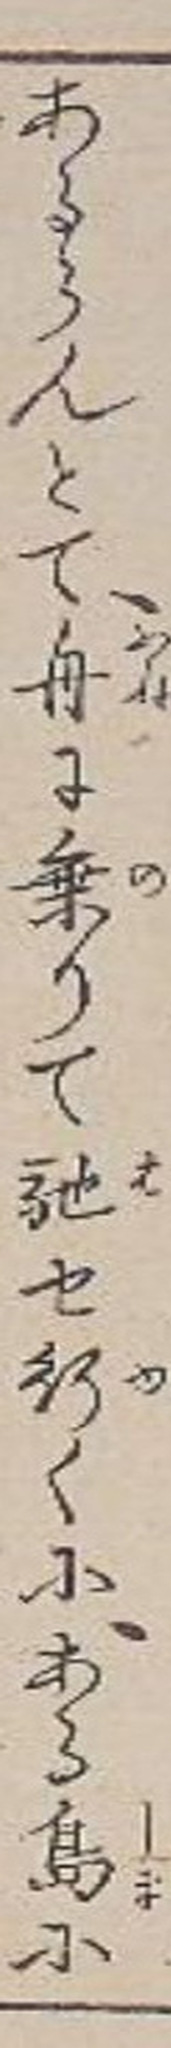あるらんとて、舟に乗りて馳せ行くに、ある島に
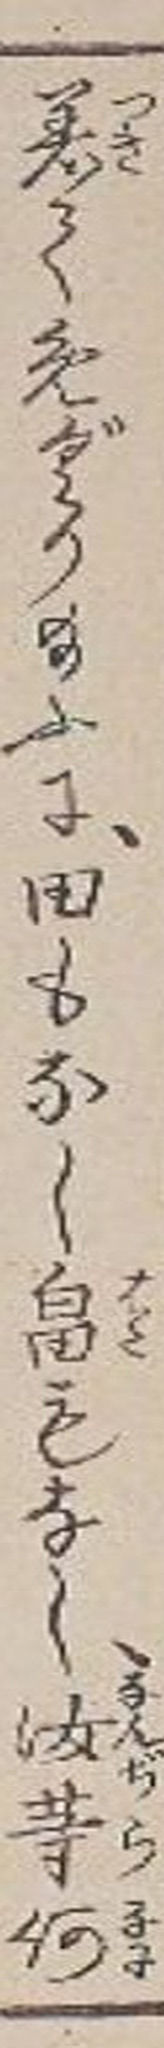着てめぐり給ふに、田もなし畠もなし、汝等何
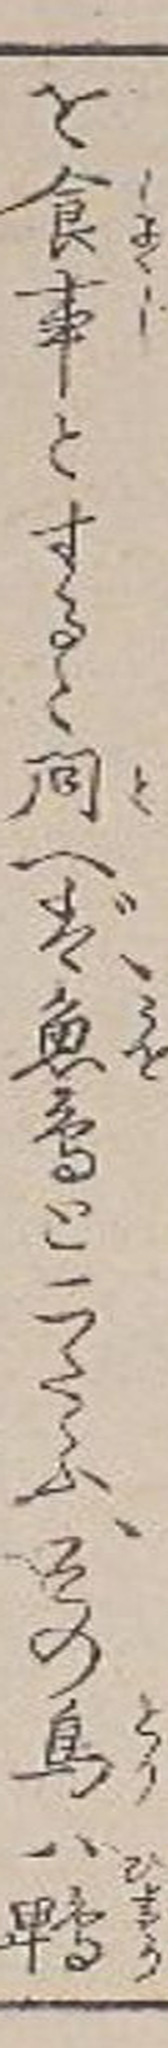を食事とすると問へば、魚鳥とこたふ、その鳥は鵯
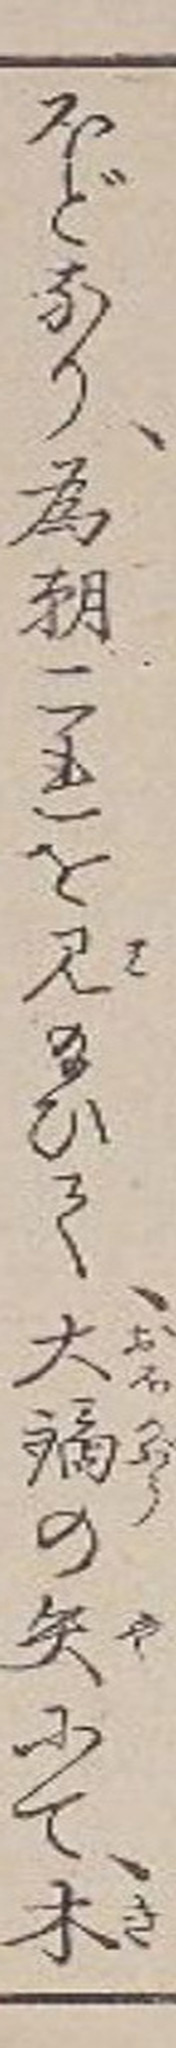ほどなり、為朝これを見給ひて、大鏑の矢にて、木
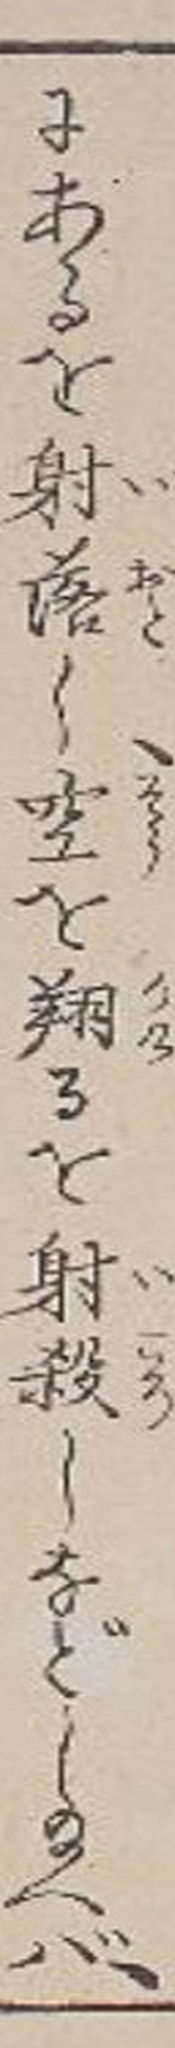にあるを射落し、空を翔るを射殺しなどし給へば、
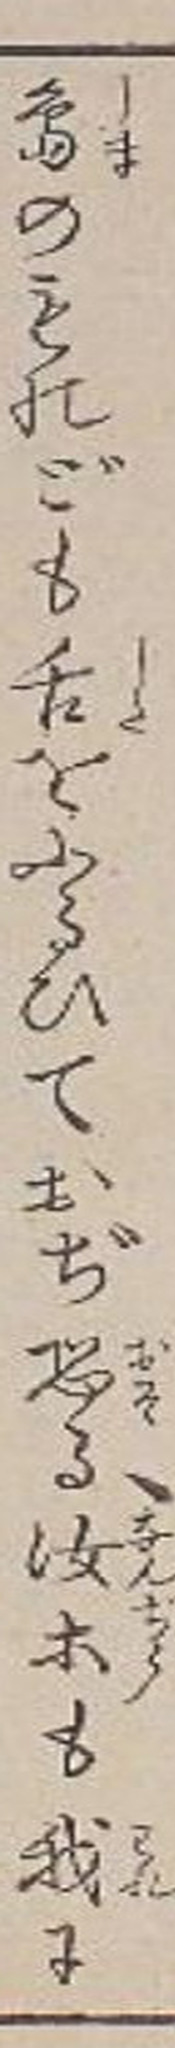島のものども舌をふるひておぢ恐る、汝等も我に
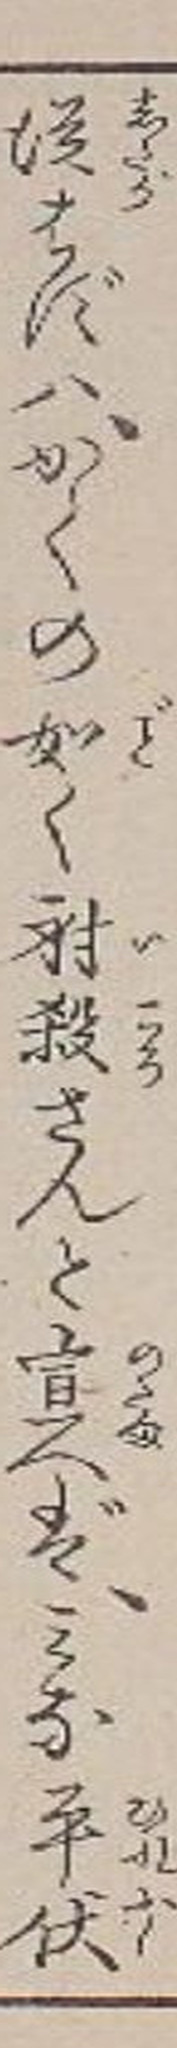従はずは、かくの如く射殺さんと宣へば、みな平伏
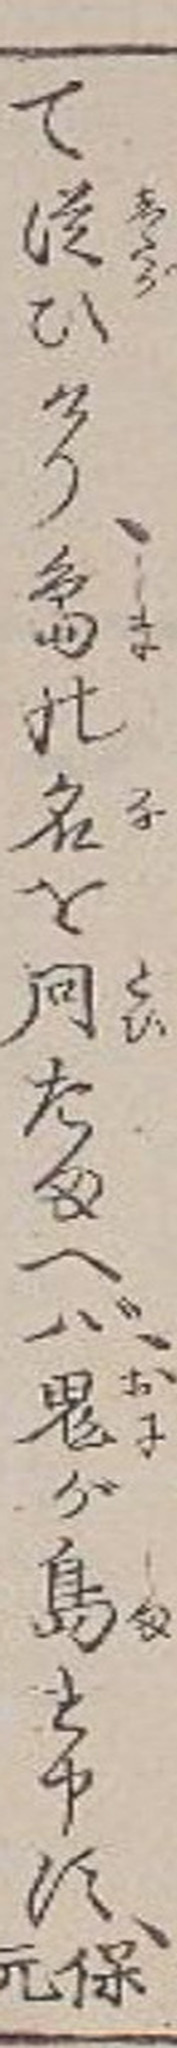て従ひけり、島の名を問たまへば、鬼が島と申す、保元
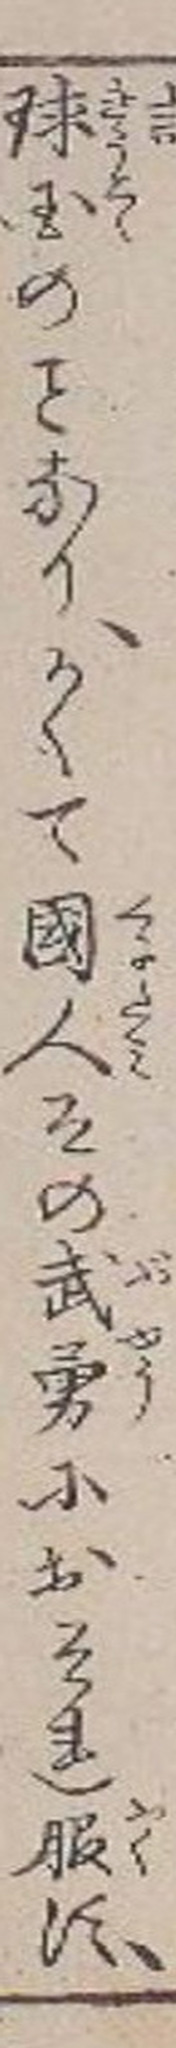球国のことなり、かくて国人その武勇におそれ服す、

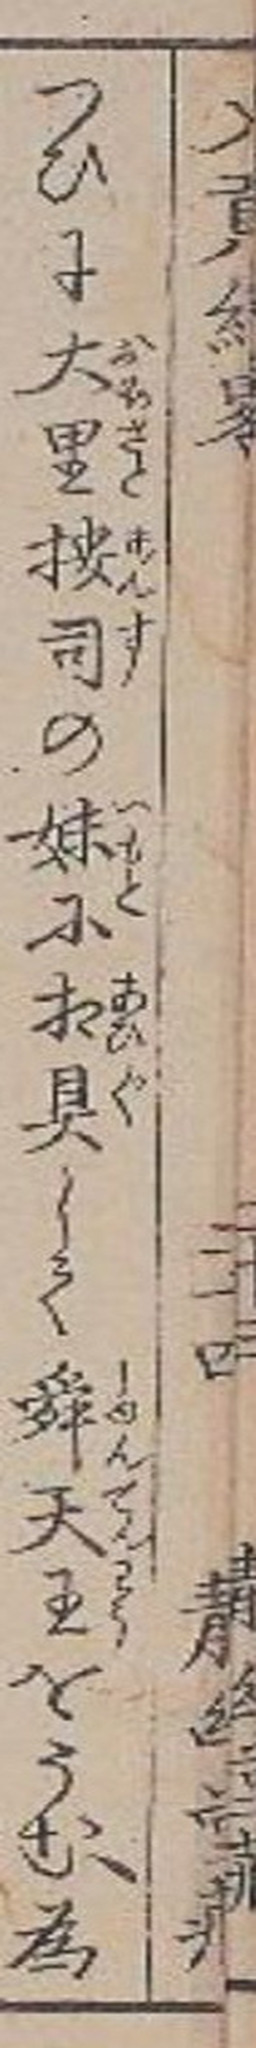つひに大里按司の妹に相具して舜天王をうむ、為
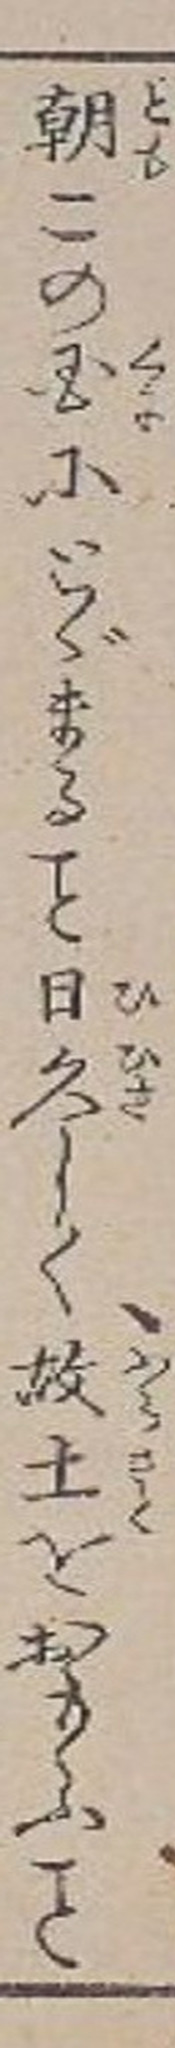朝この国にとゞまること日久しく、故土をおもふこと
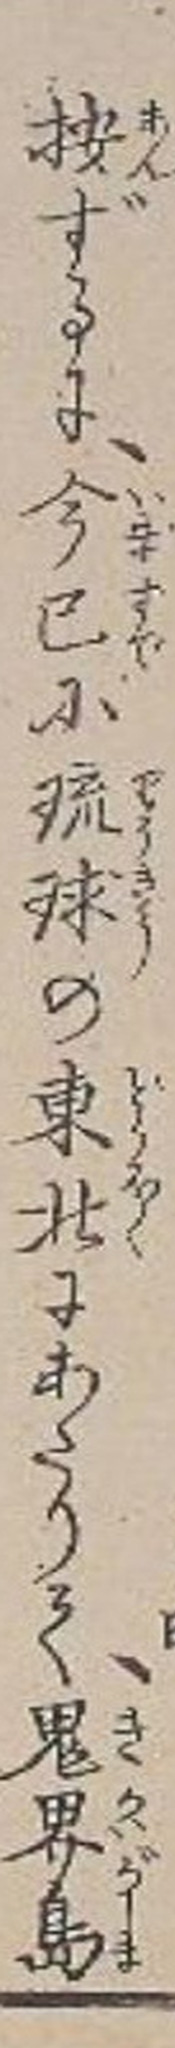按ずるに、今已に琉球の東北にあたりて、鬼界島
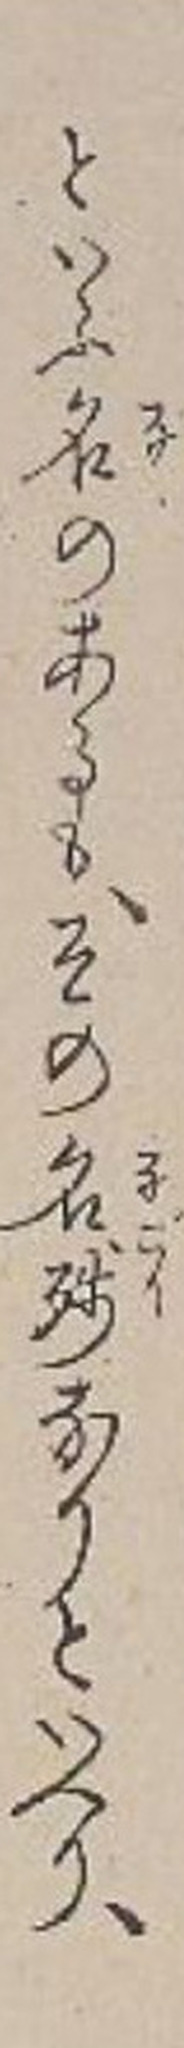といふ名のあるも、その名残なりといへり、
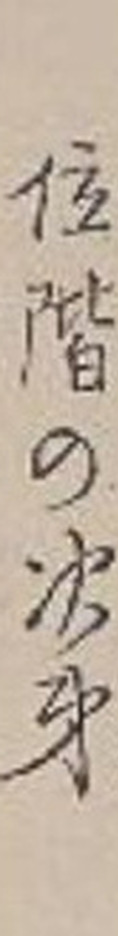位階の次第
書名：琉球入貢紀略
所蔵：University of the Ryukyus Library
